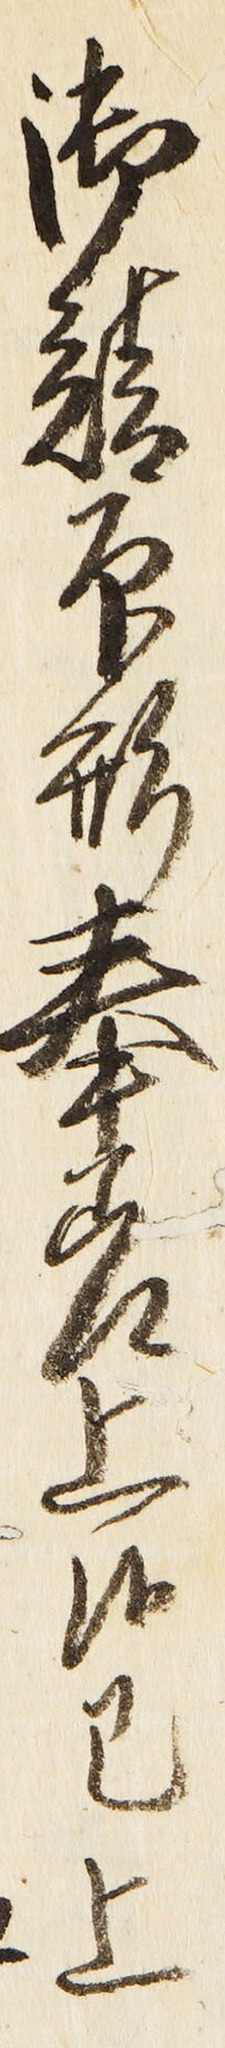御請印形奉差上候已上
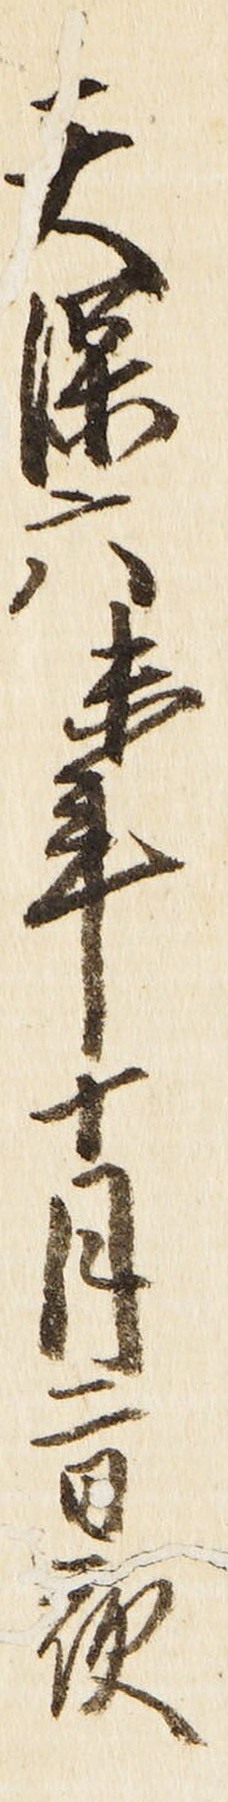天保六未年十月二日夜
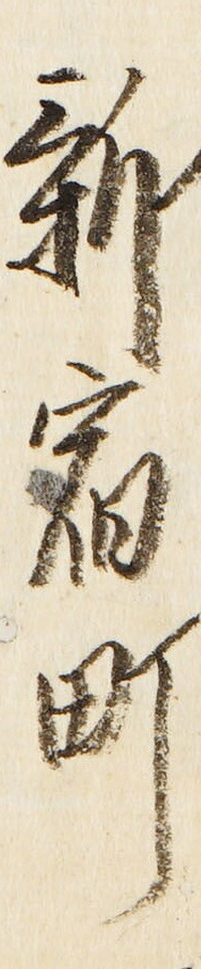新宿町
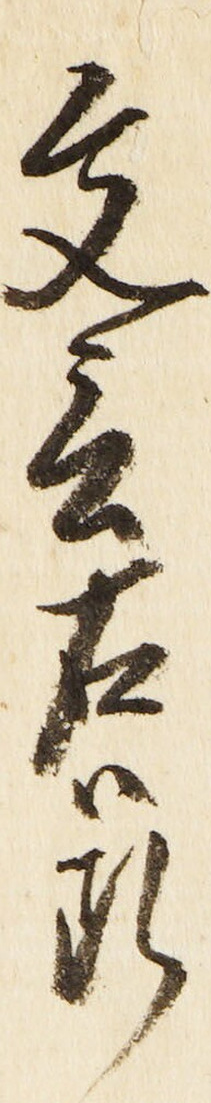文言右同断
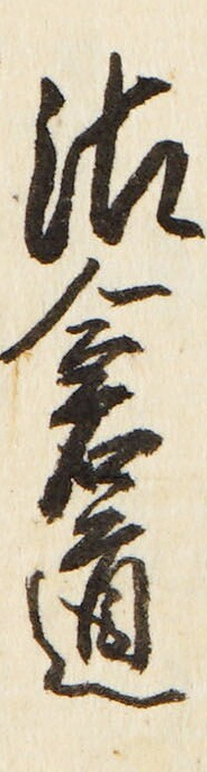佐倉道
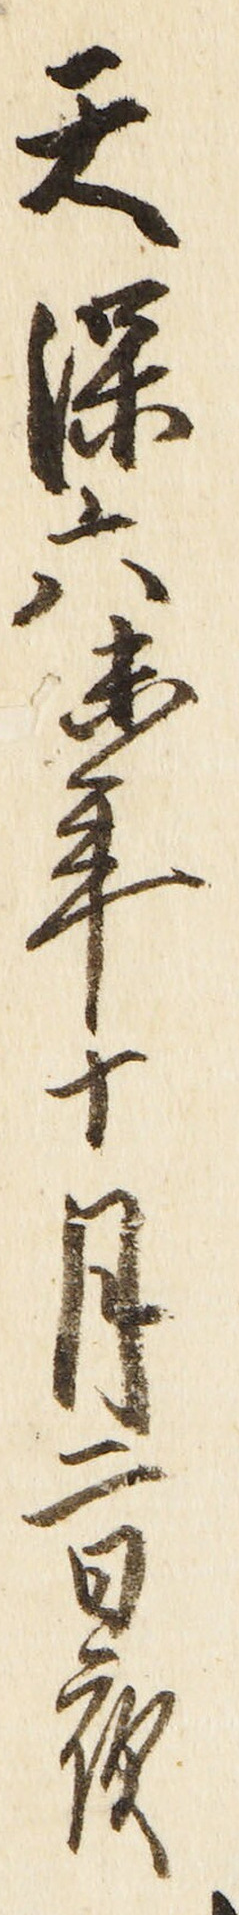天保六未年十月二日夜
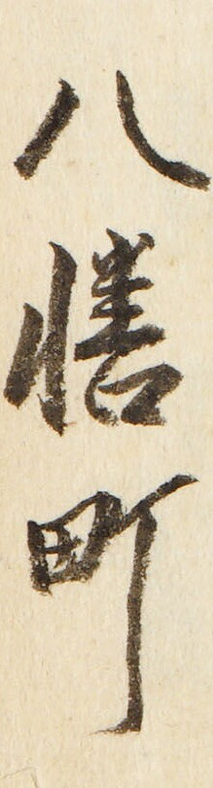八幡町

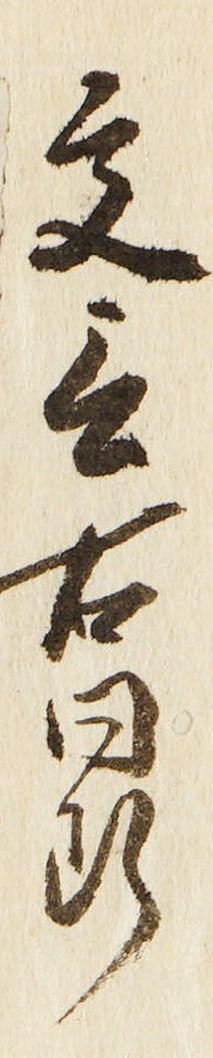文言右同断
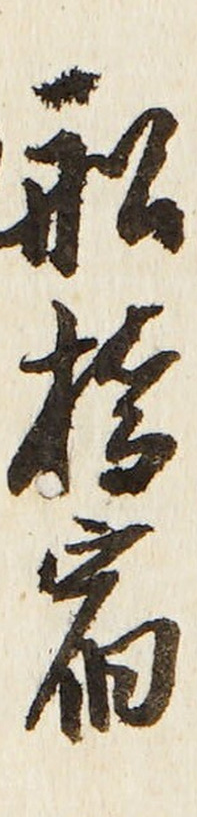舟橋宿
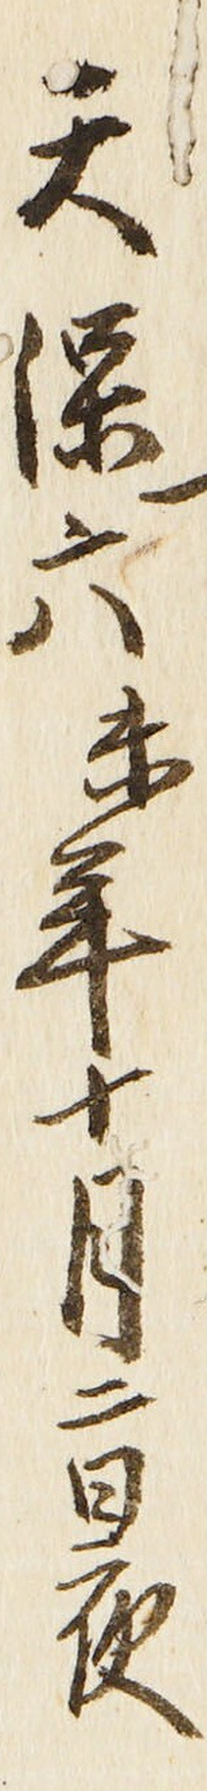天保六未年十月二日夜
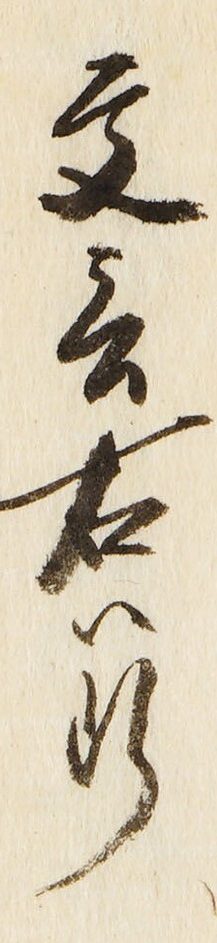文言右同断
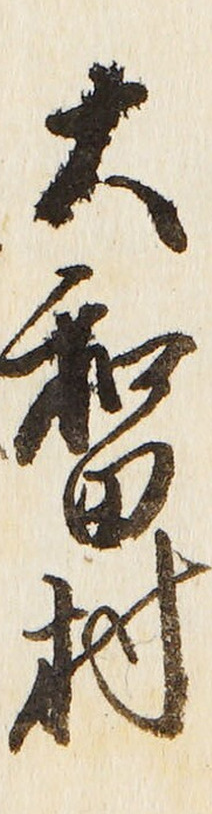大和田村
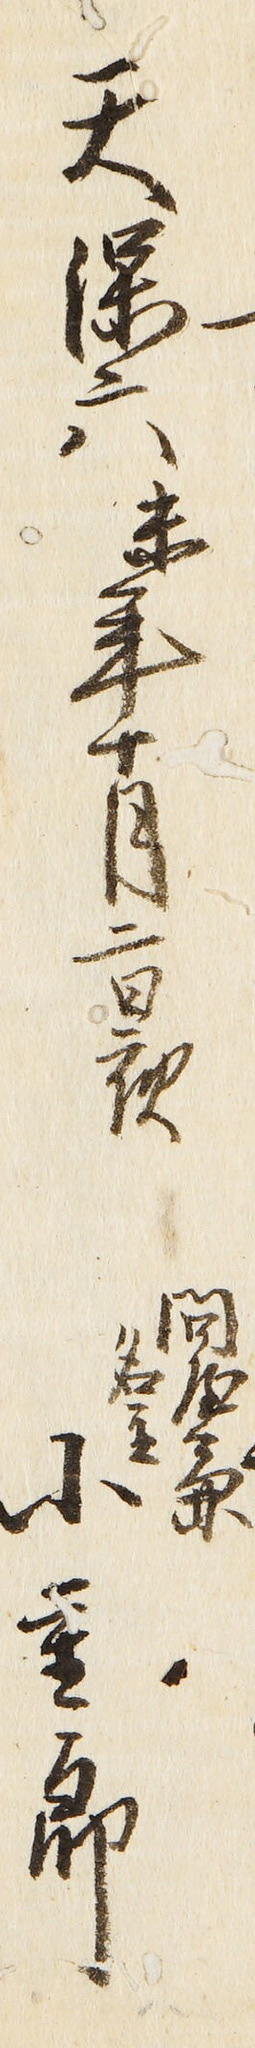天保六未年十月二日夜
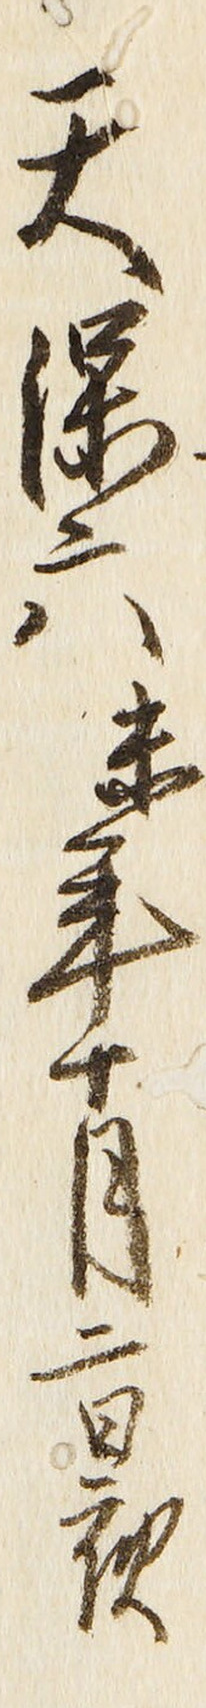天保六未年十月二日夜
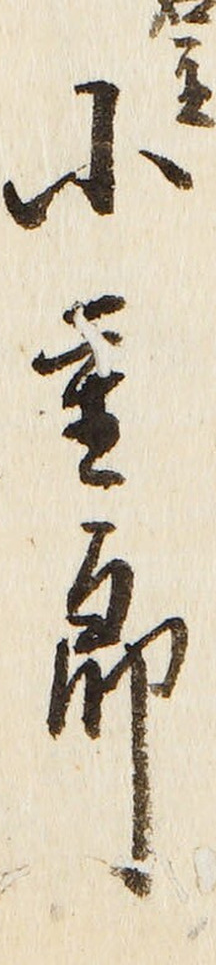小重郎
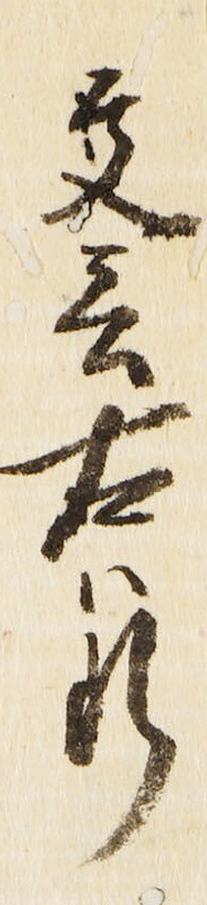文言右同断
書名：難船一件記録
